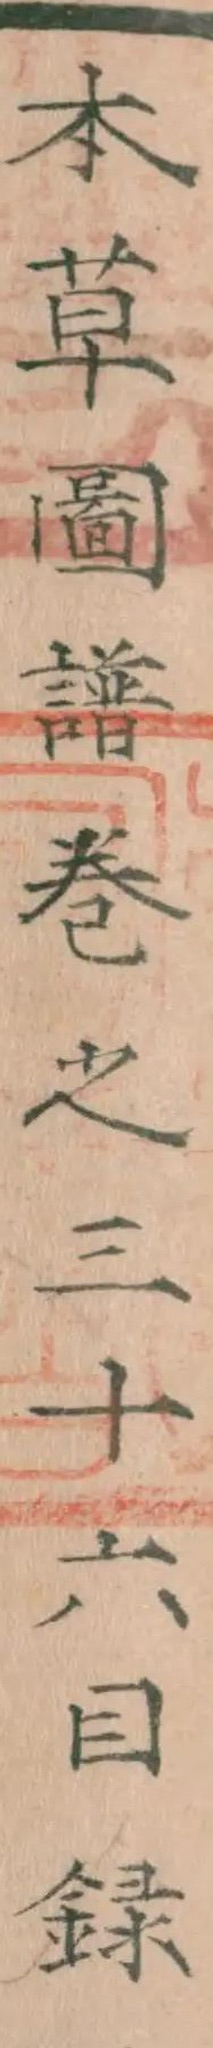本草図譜巻之三十六目録
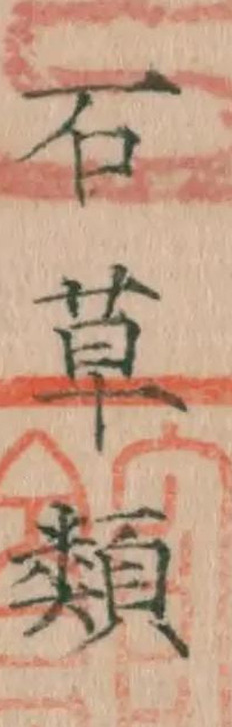石草類

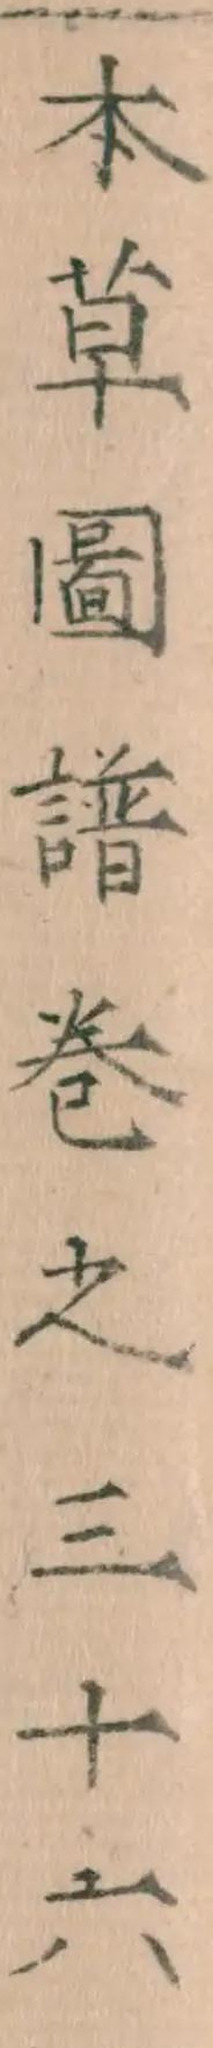本草図譜巻之三十六
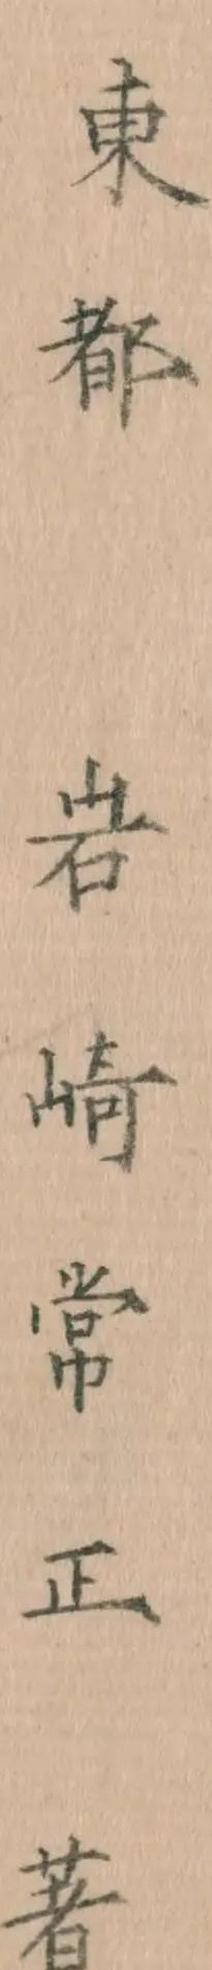東都岩崎常正著
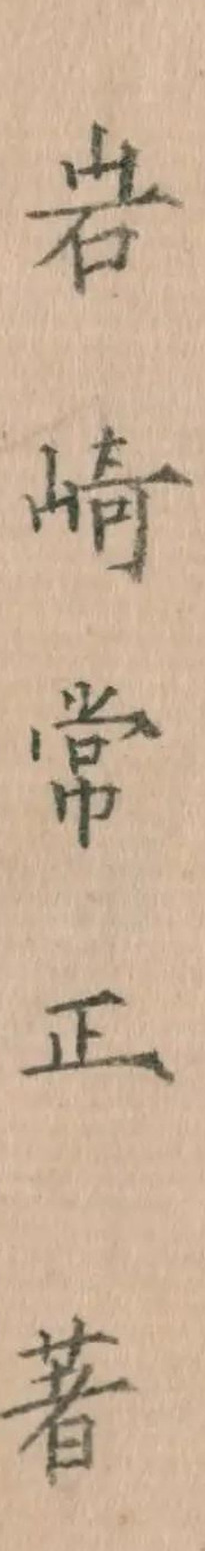東都岩崎常正著
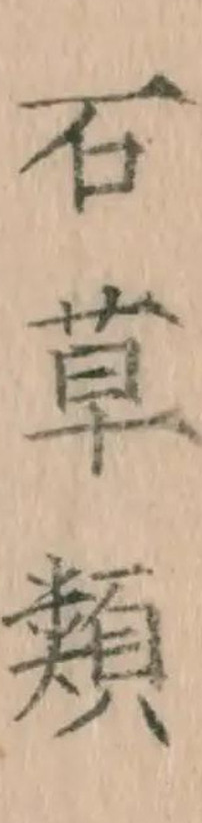石草類
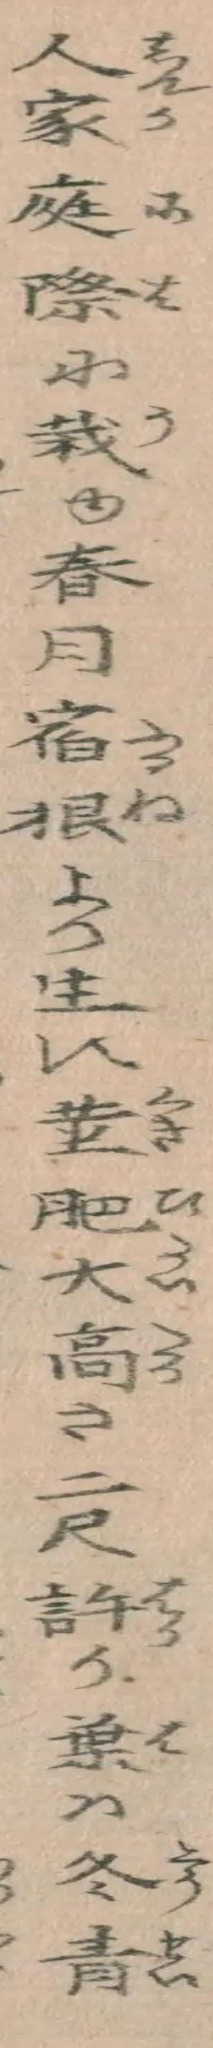人家庭際に栽ゆ春月宿根より生す茎肥大高さ二尺許り葉は冬青
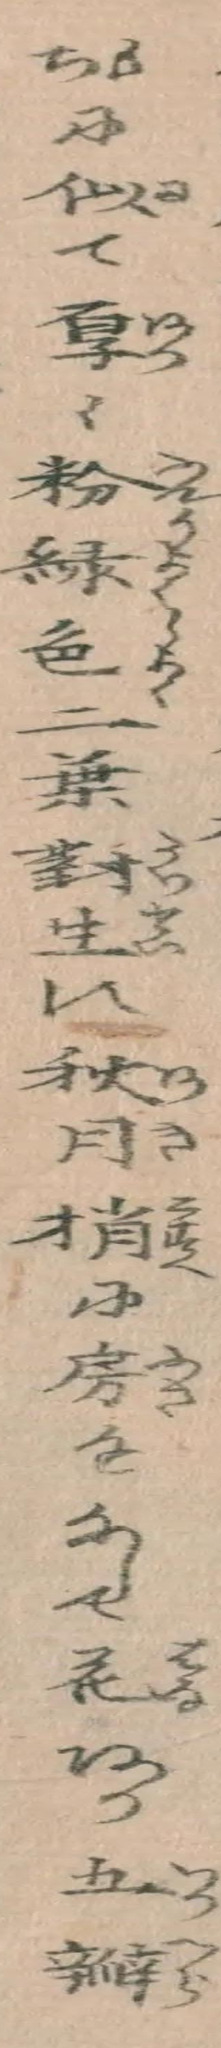もちに似て厚く粉緑色二葉対生す秋月梢に房をなして花あり五弁
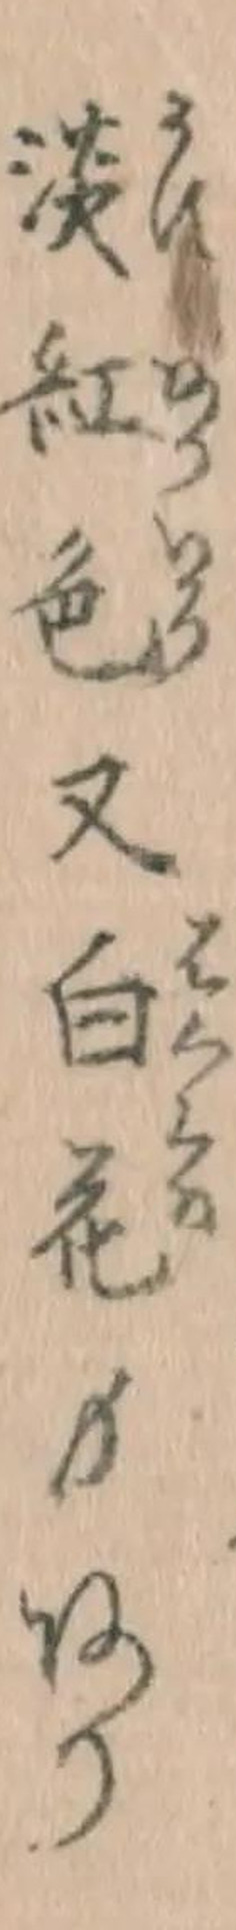淡紅色又白花もあり

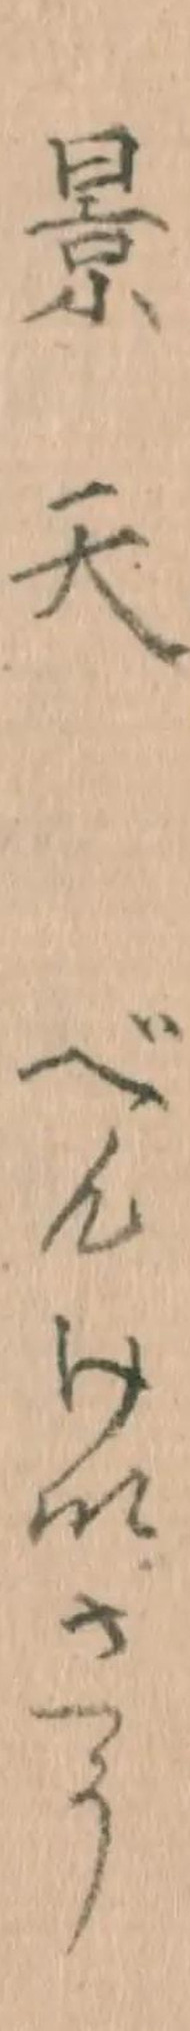景天べんけいさう
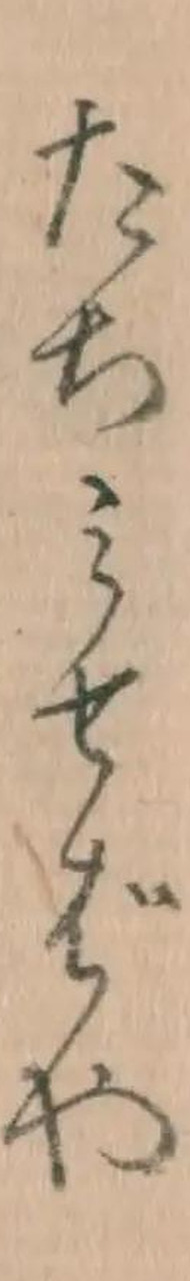たちみせはや
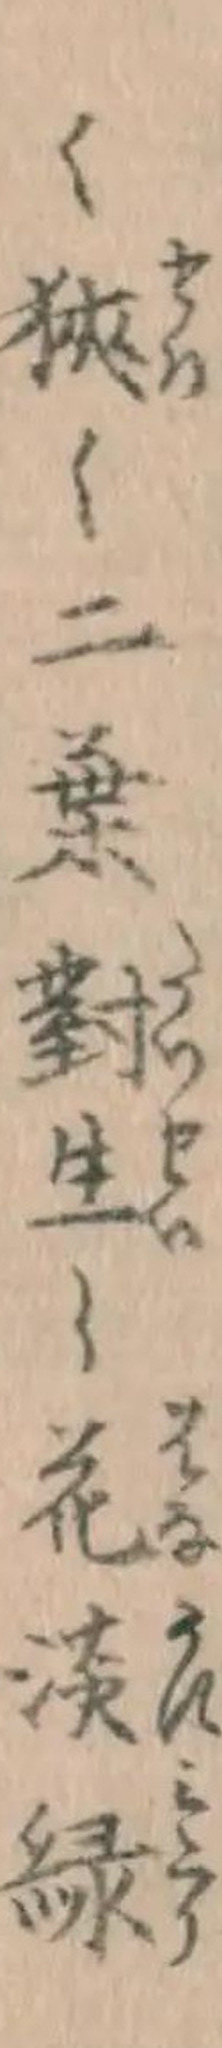く狭く二葉対生し花淡緑

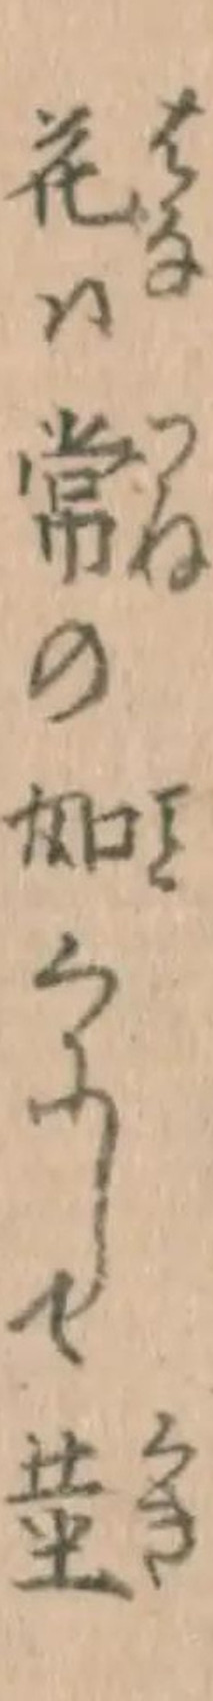花は常の如くにして茎
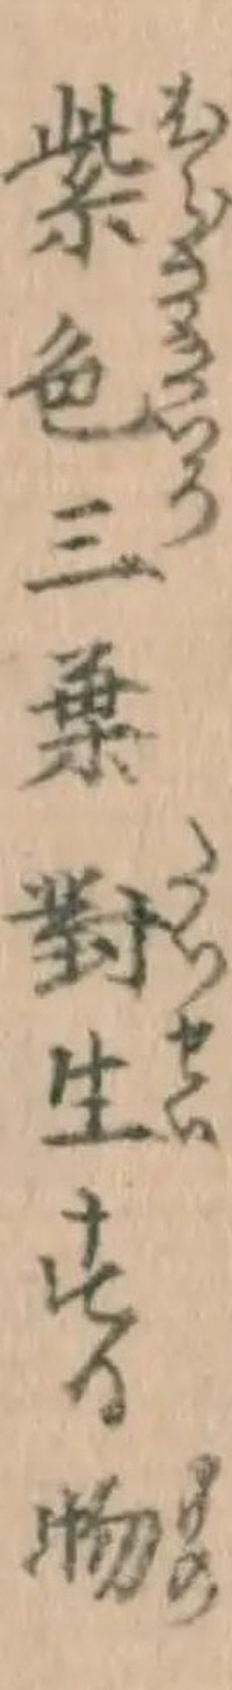紫色三葉対生する物
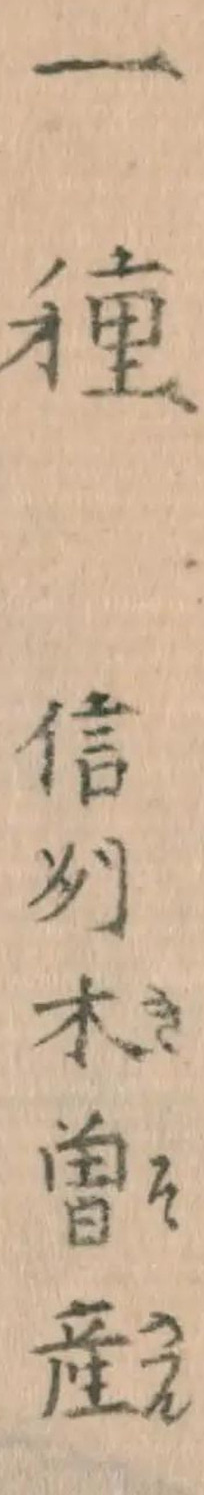一種信州木曽産
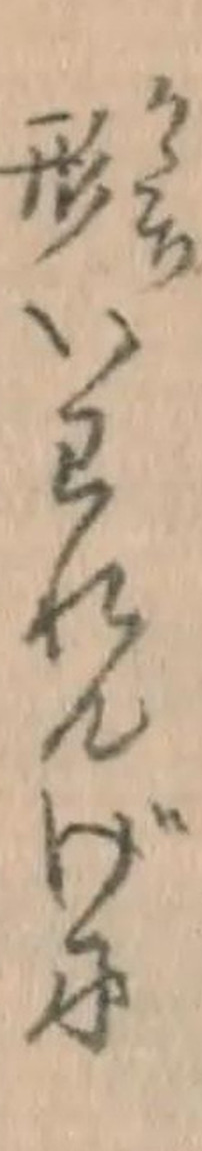形いわれんげに
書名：本草図譜. 巻34-36
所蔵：国立国会図書館 National Diet Library, JAPAN
